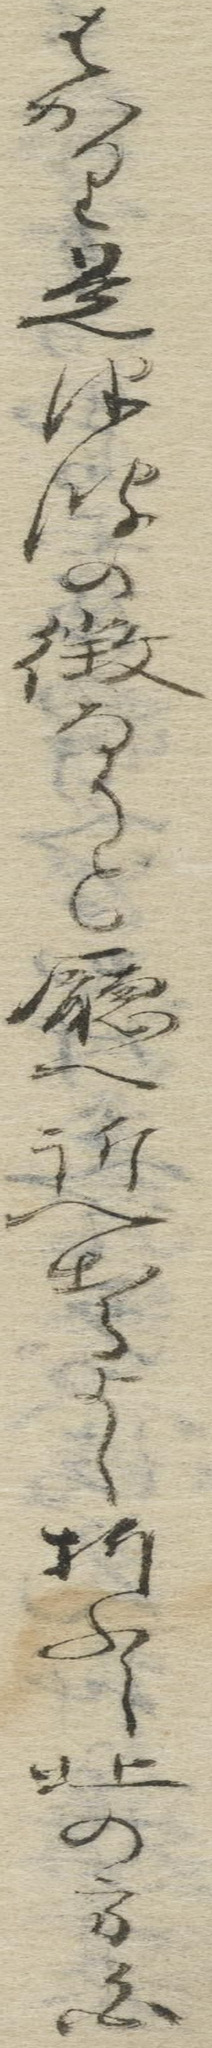はかり是津波の徴なりと庁へ訴へ出るよし折ふし北の方白
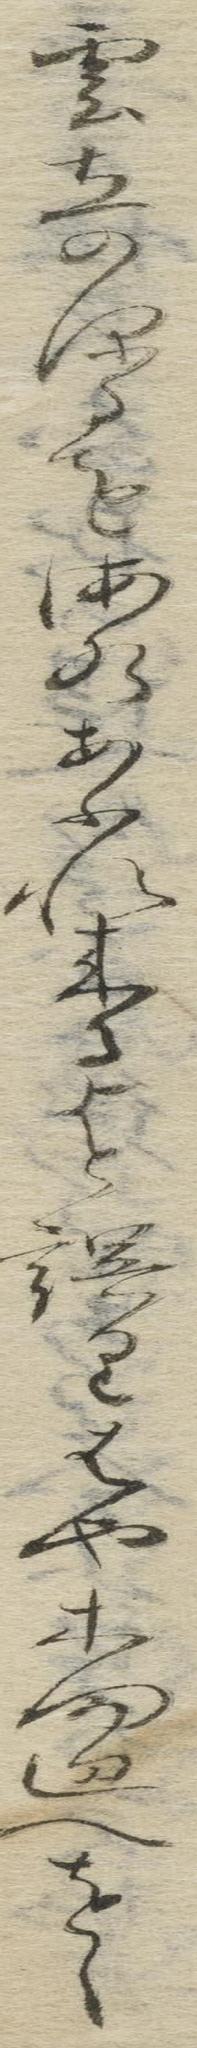雲立のほるを海水あふれ来るよと誤りはや木田辺へをし
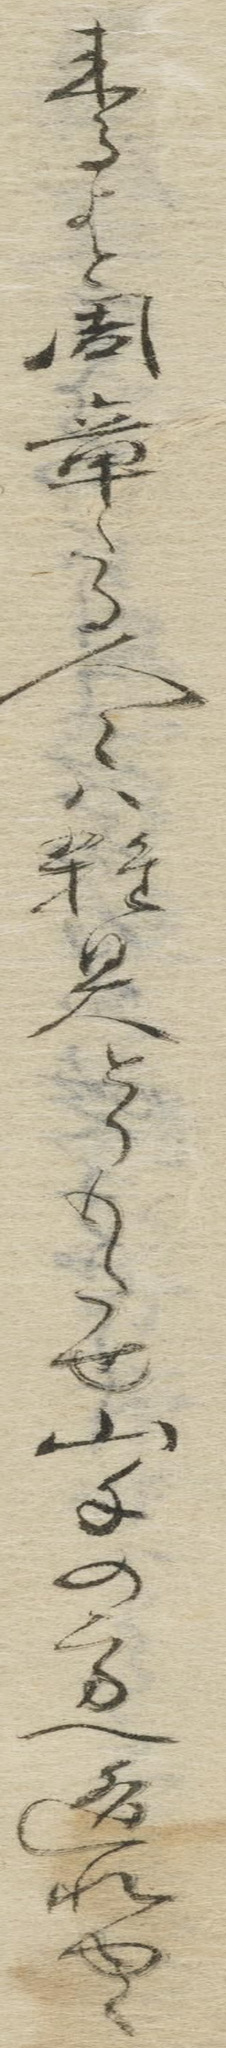来るよと周章たる人々ハ雑具とりもたせ山手の方へ遁れゆく
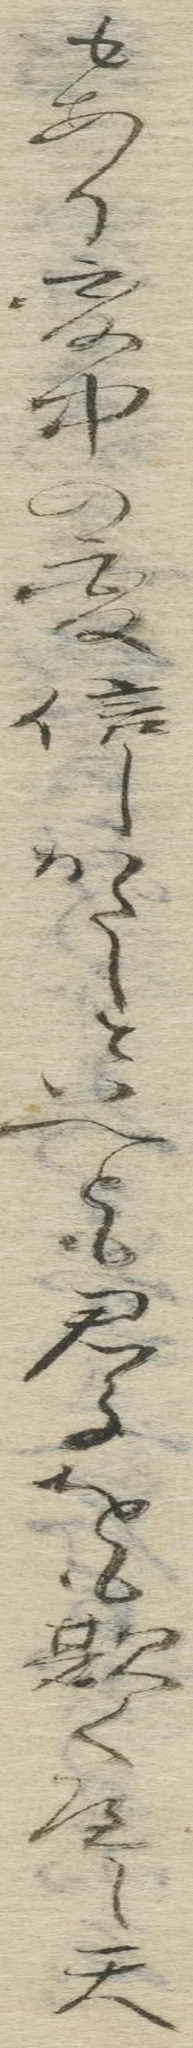もあり夜中の変信しかたしといへとも君子をも欺くへし天
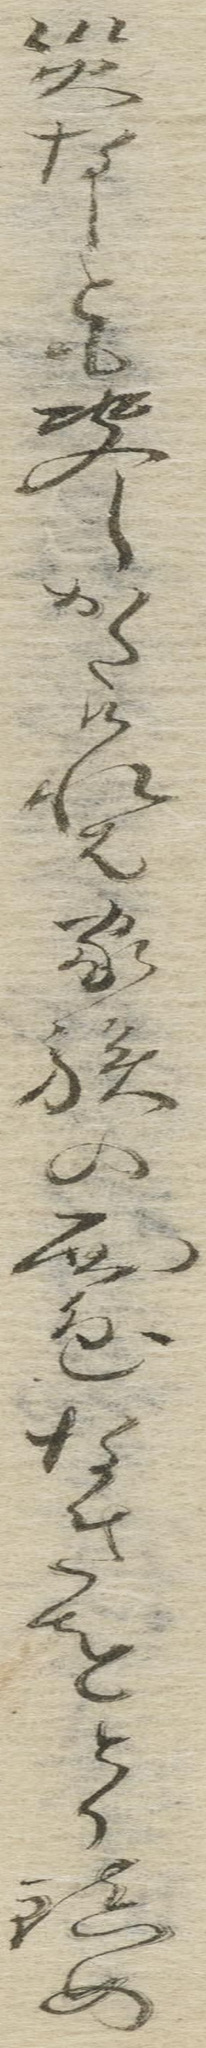災なしとも決しかたけれは家族の面色なきをとり鎮め
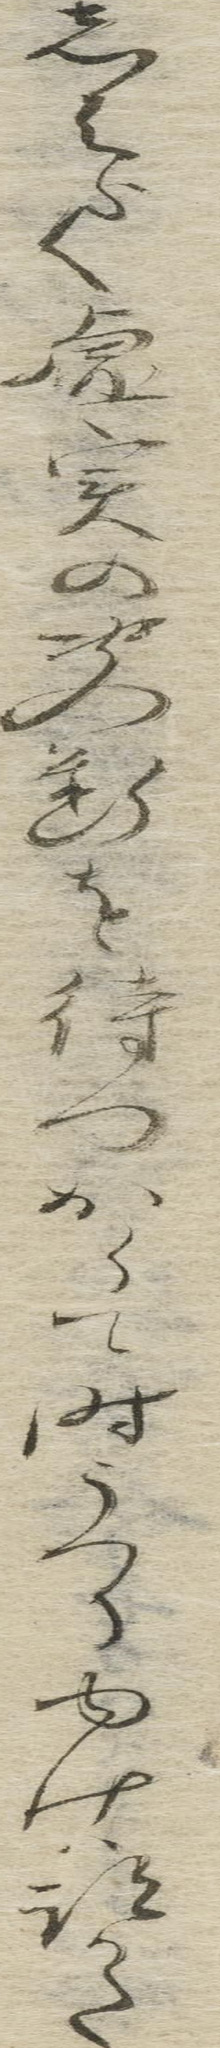しはらく虚実の決断を待つかくて時うつりゆけハ跡かた
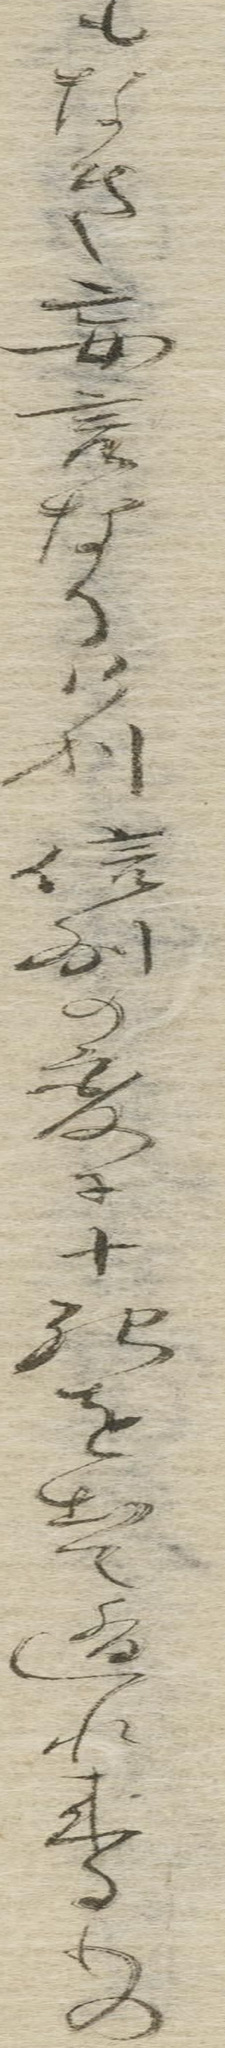もなき妄言なりけり信州の変に十駅を出て遁れ来るもの
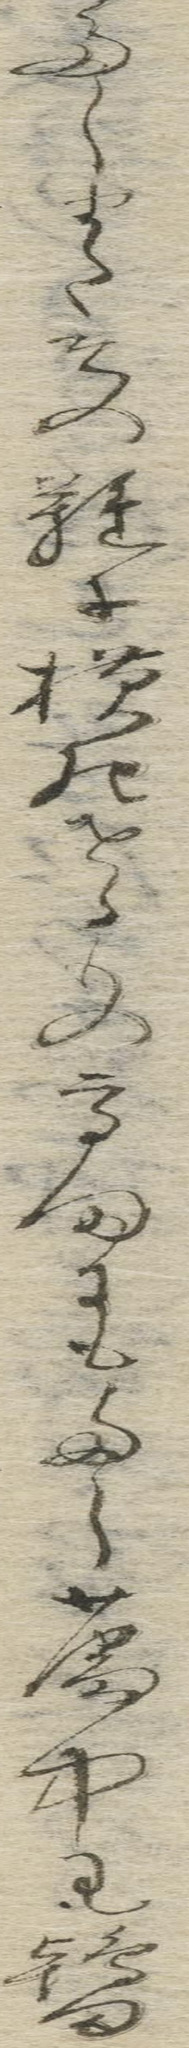多しまたその難に横死せるもの高田にも多し藩中に鴇田
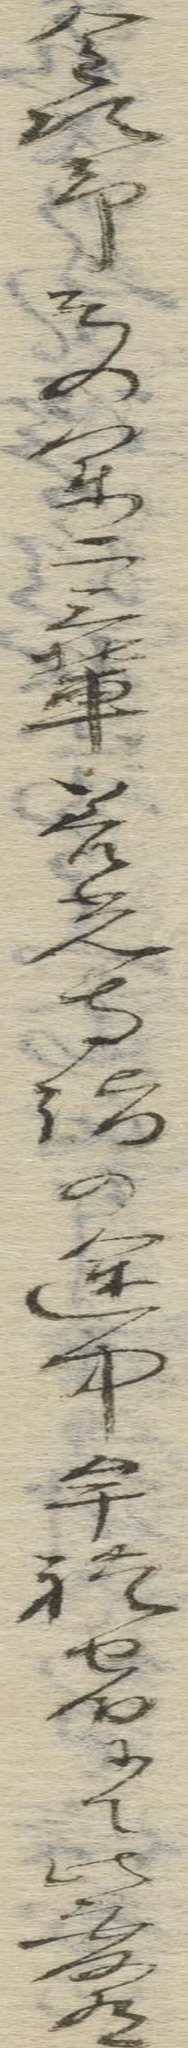金次郎そのつれ二三輩善光寺詣の途中牟礼宿にて此変有
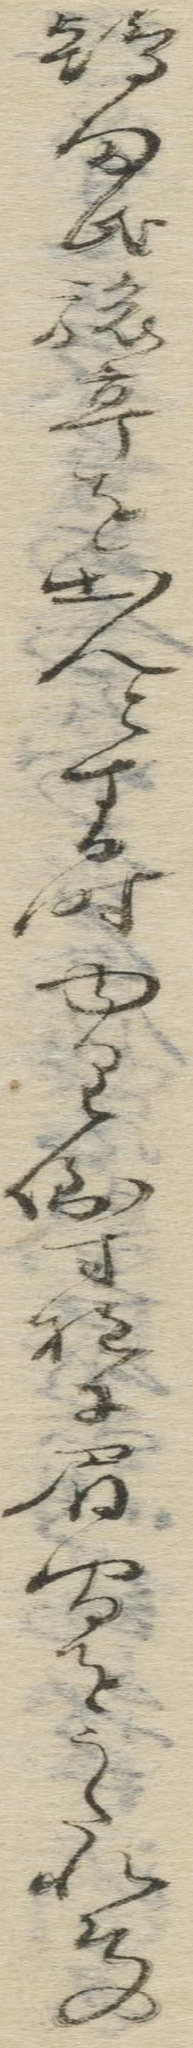鴇田氏旅亭を出んとする時ゆり倒す柱に眉間をうたれその
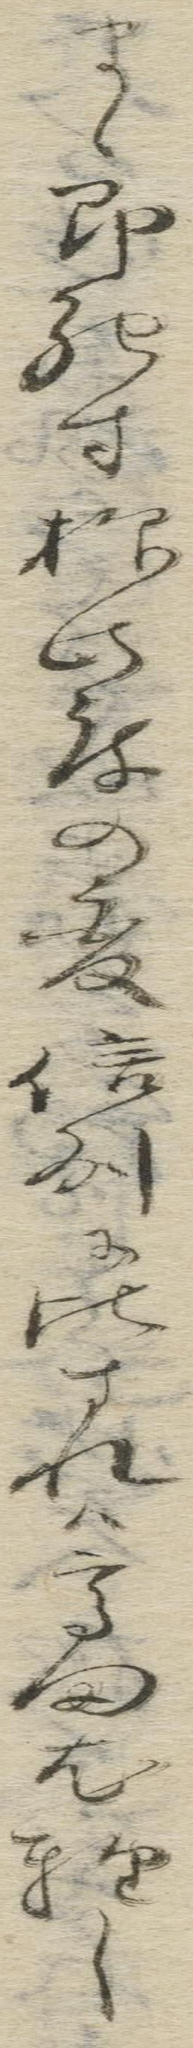まゝ即死す抑此度の変信州に比すれハ高田尤軽し
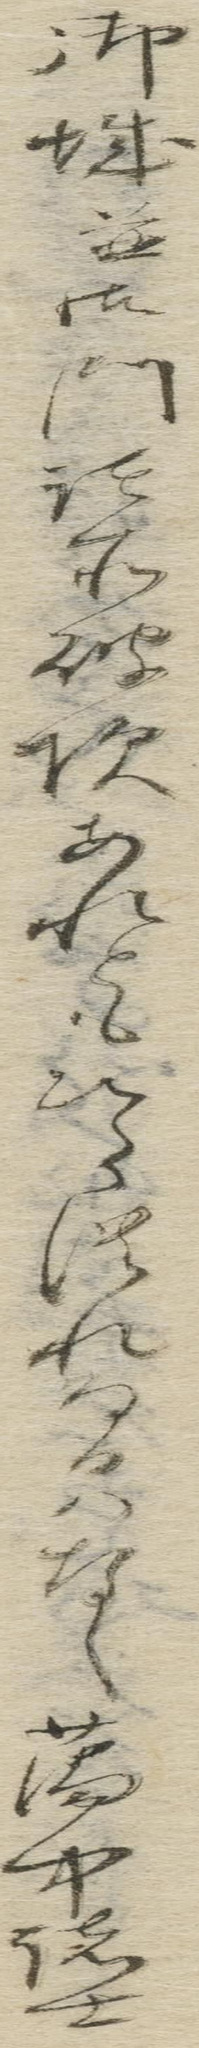御城並御門諸所破損あれともひた潰れなるハなし藩中諸士
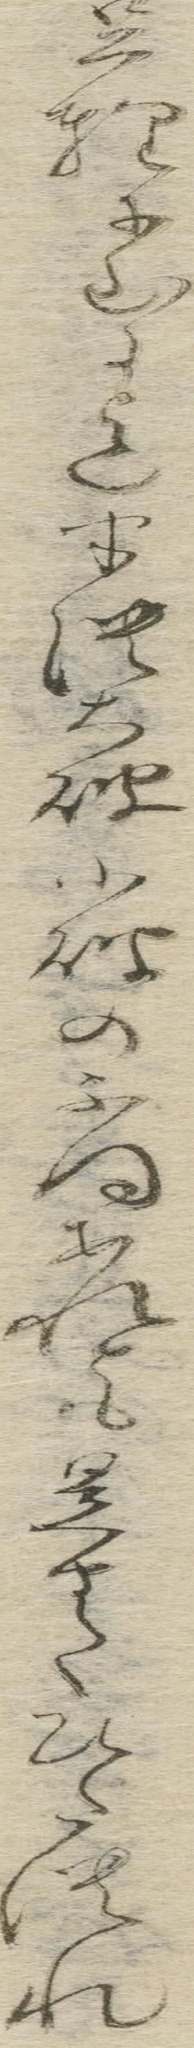足軽に至る迄半潰大破小破の不同あれとも是またひた潰れ
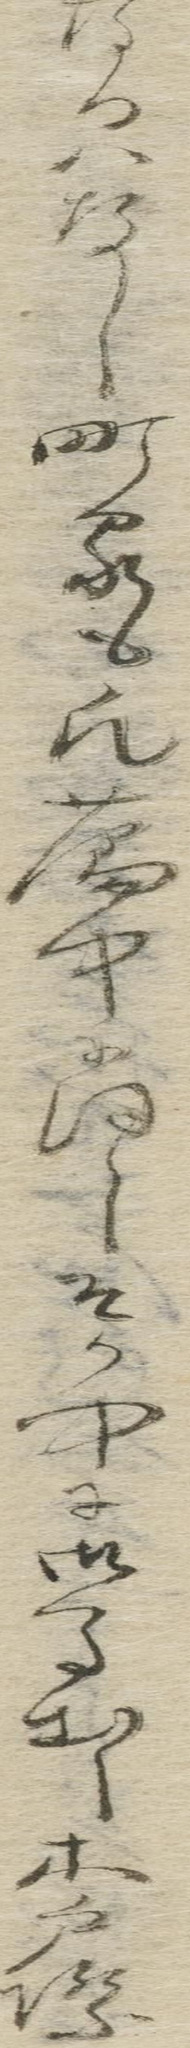なるハなし町家も凡藩中に同しそか中に御馬出し木戸際
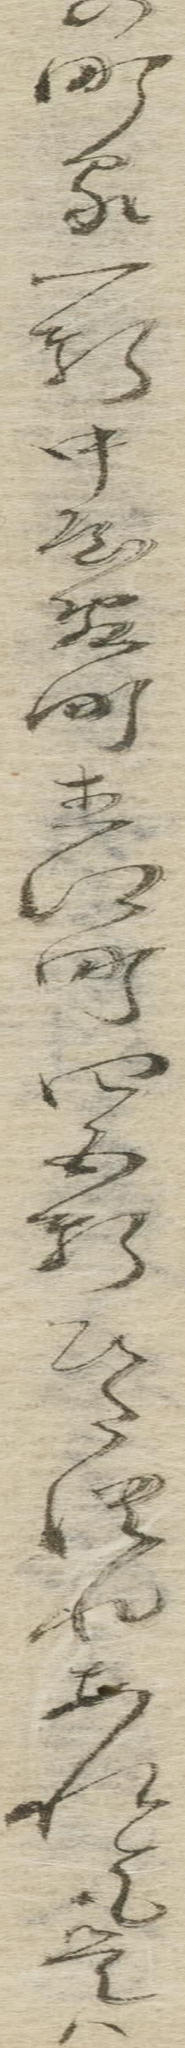の町家一軒中屋敷町直江町四五軒ひた潰れあれとも是ハ
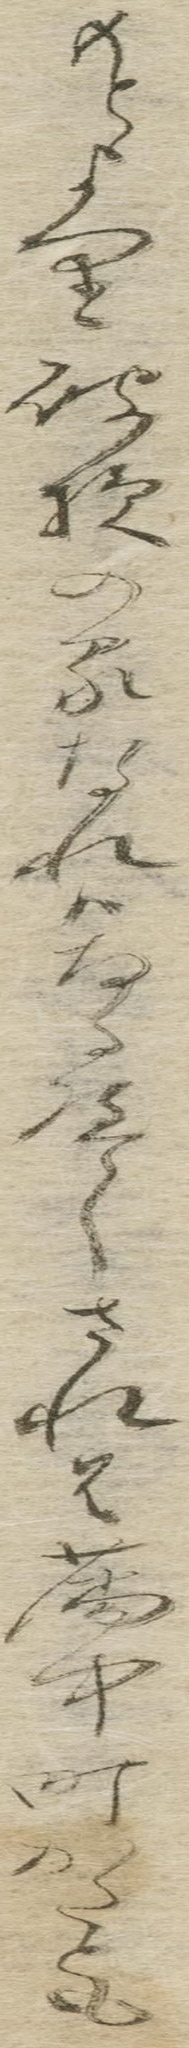もとより破損の家なれハなるへしされは藩中町かたとも
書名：弘化丁未天變日記
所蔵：東京大学地震研究所図書室 Earthquake Research Institute Library, The University of Tokyo, JAPAN
